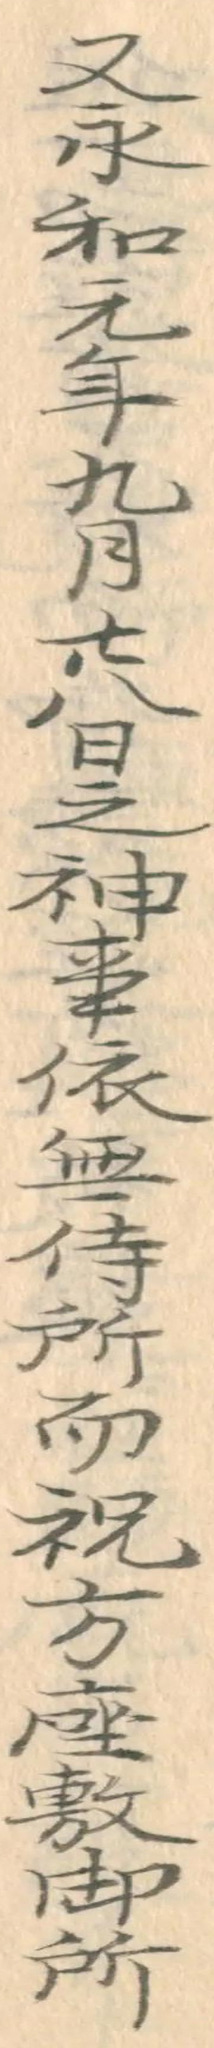又永和元年九月廿八日之神事依無侍所而祝方座敷御所
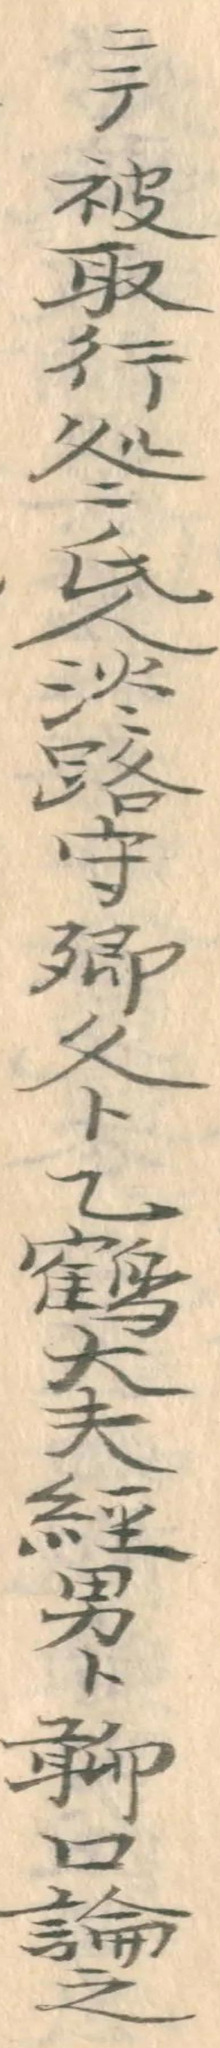ニテ被取行処ニ氏人淡路守郷久ト乙鶴大夫経男ト聊口論之
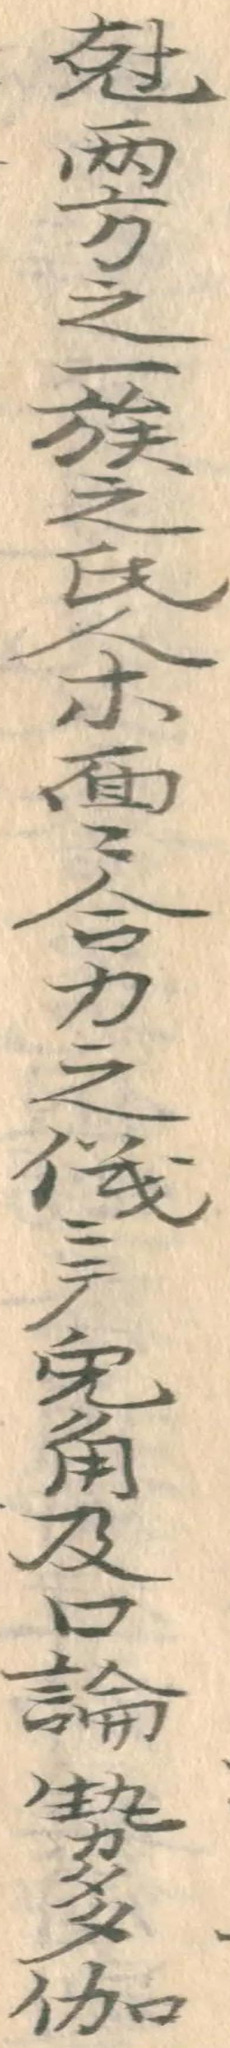剋両方之一族之氏人等面々合力之儀ニテ兎角及口論勢多伽
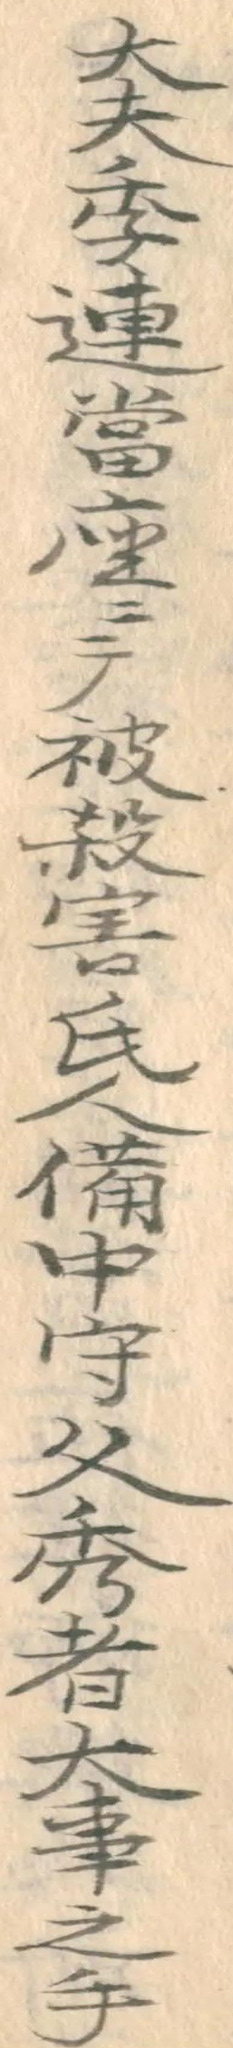大夫季連当座ニテ被殺害氏人備中守久秀者大事之手
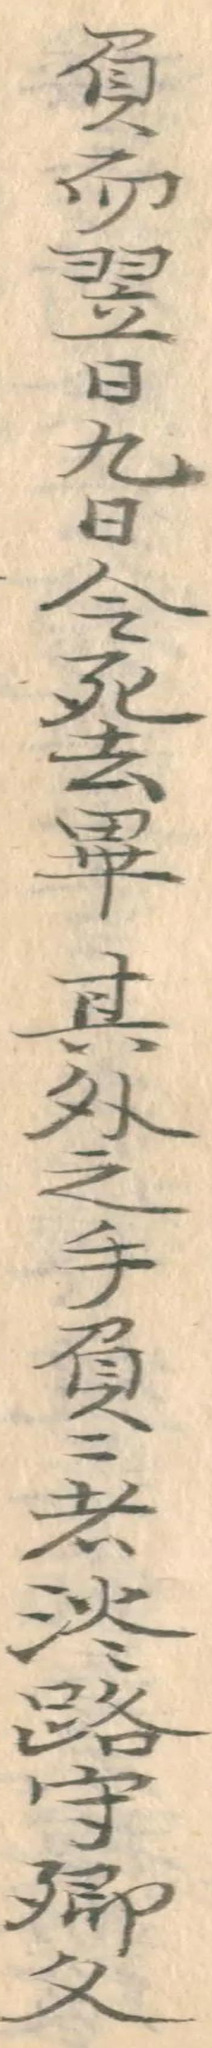負而翌日九日令死去畢其外之手負ニ者淡路守郷久
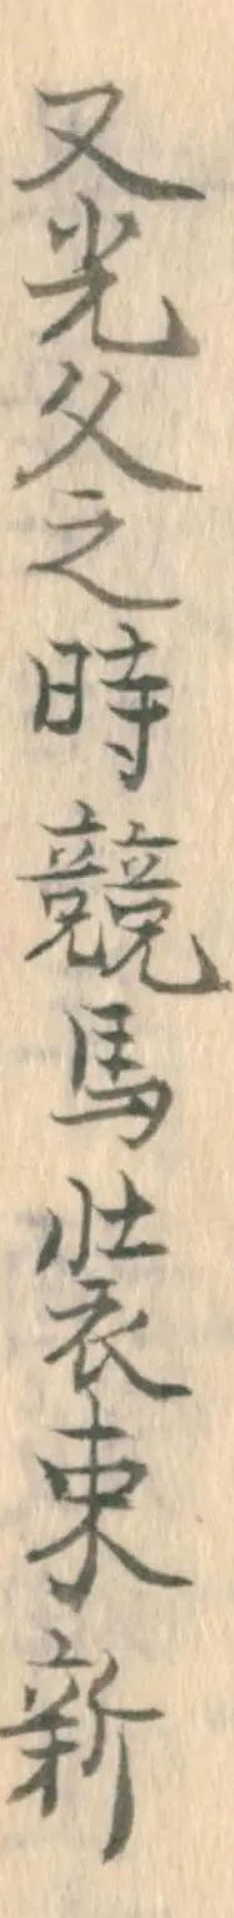又光久之時競馬装束新
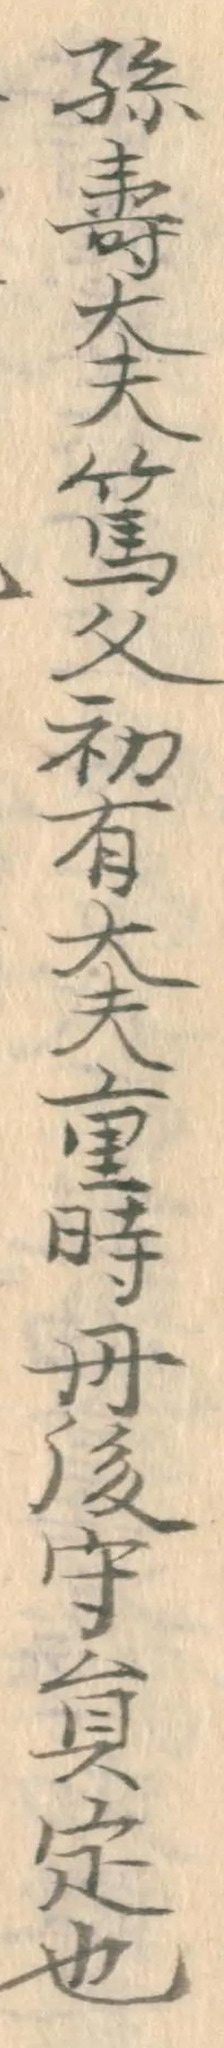孫寿大夫篤久初有大夫重時丹後守員定也
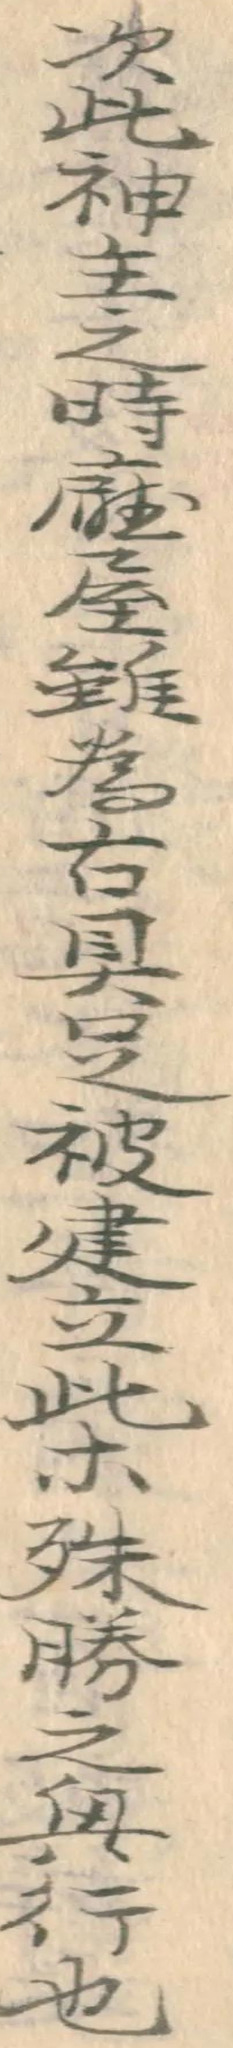次此神主之時庁屋雖為古具足被建立此等殊勝之興行也
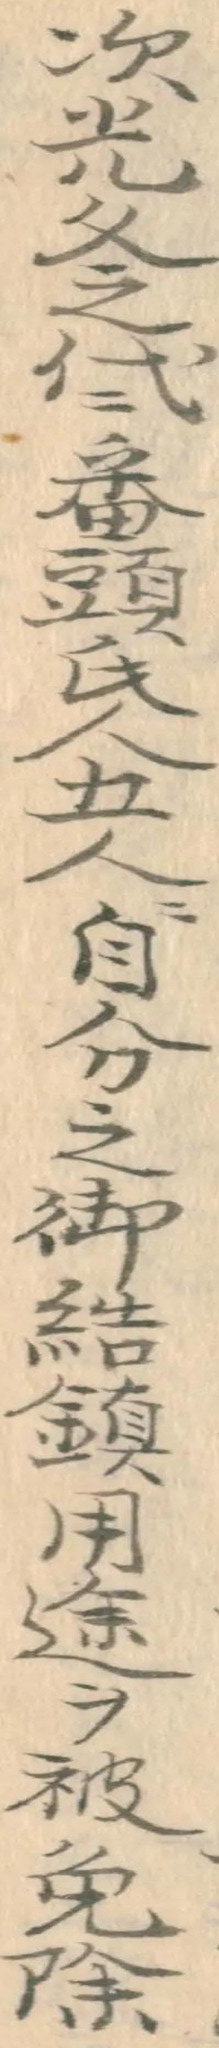次光久之代ニ番頭氏人五人ニ自分之御結鎮用途ヲ被免除
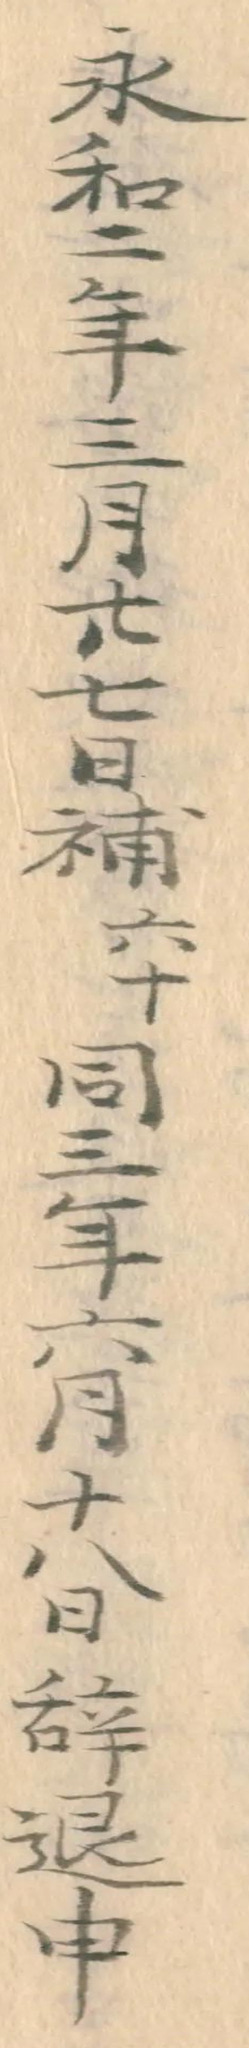永和二年三月廿七日補六十同三年六月十八日辞退申
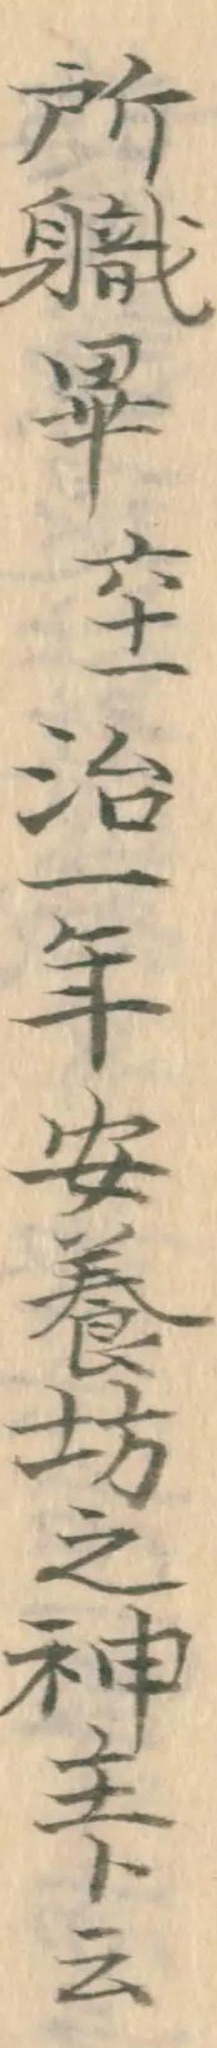所職畢六十一治一年安養坊之神主ト云
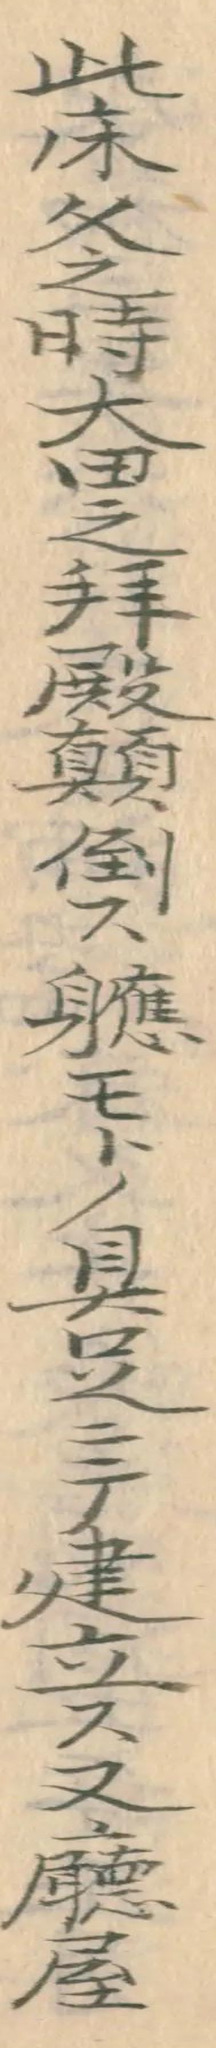此床久之時大田之拝殿顛倒ス軈モトノ具足ニテ建立ス又庁屋
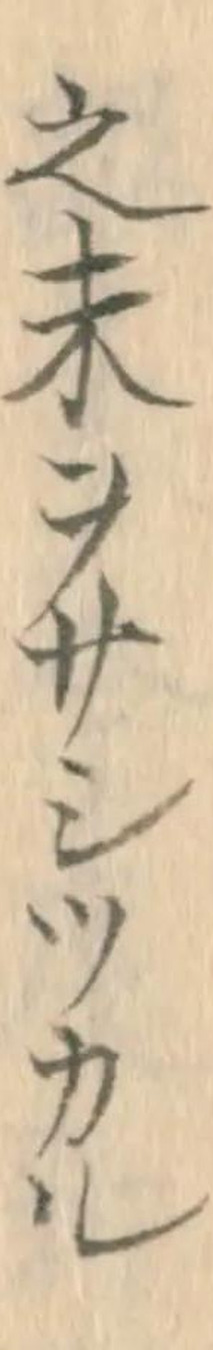之末ヲサシツカル
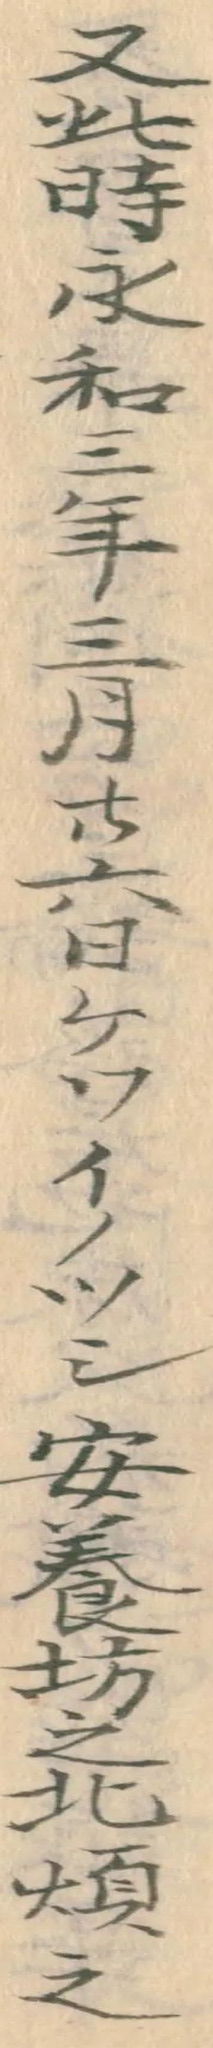又此時永和三年三月廿六日ケワイノツシ安養坊之北煩之
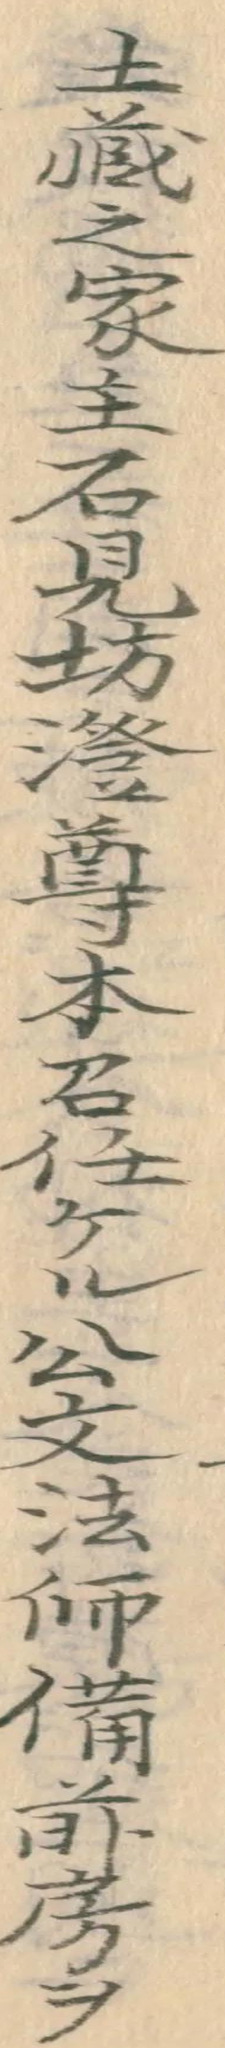土蔵之家主石見坊澄尊本召任ケル公文法師備前房ヲ
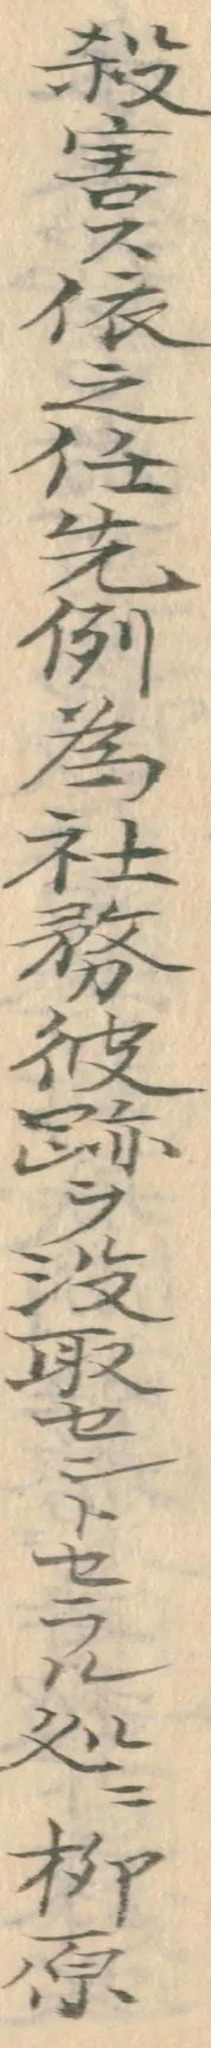殺害ス依之任先例為社務彼跡ヲ没取セントセラル処ニ柳原
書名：賀茂社記録. 第24冊
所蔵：国立国会図書館 National Diet Library, JAPAN
